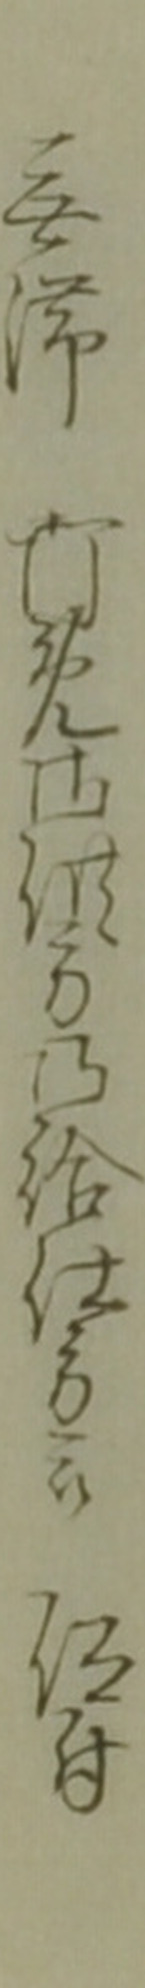無滞御免御供方御給仕方被仰付
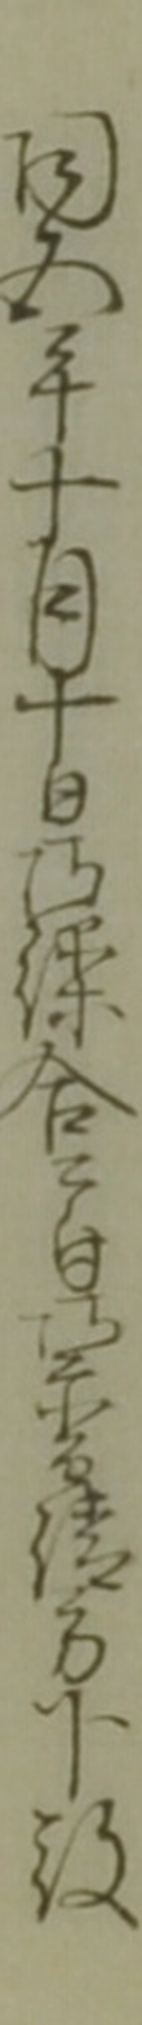一同五午十月十日御繰合ニ付御普請方下役
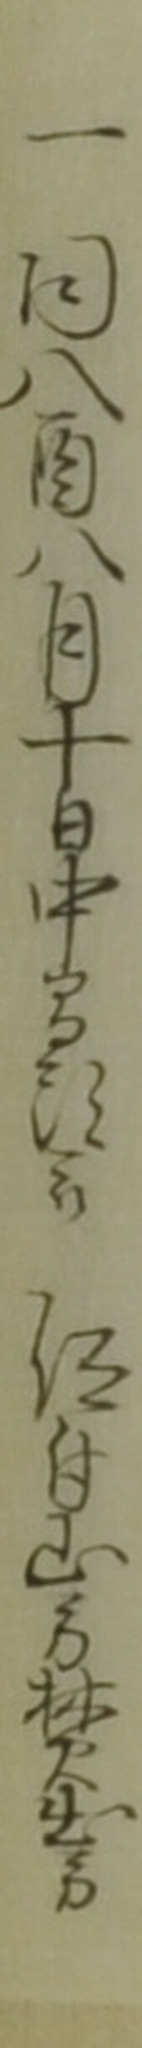一同八酉八月十日中間頭被仰付山方焚出方
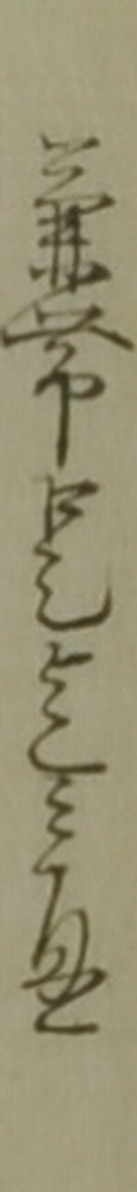兼帯是迄之通
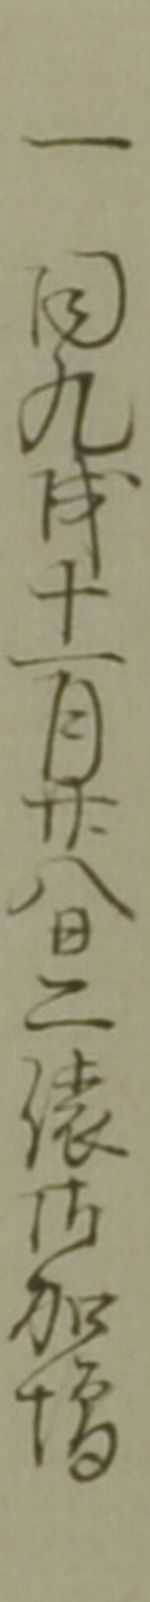一同九戌十一月廿八日二俵御加増
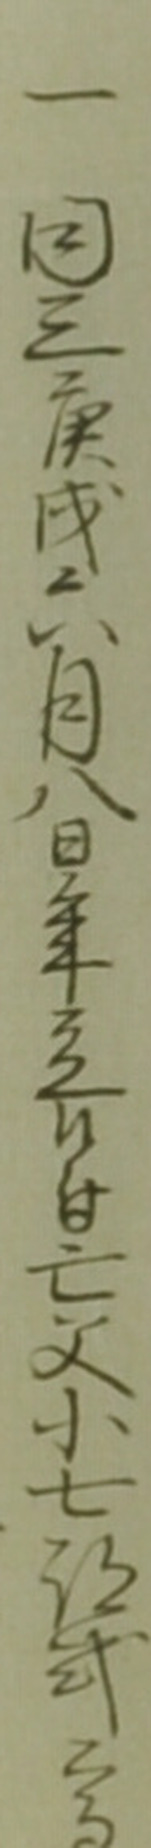一同三庚戌六月八日年立候付亡父小七跡式高
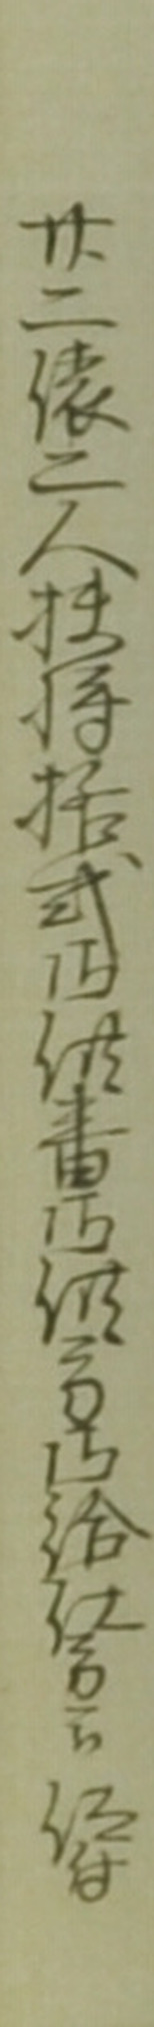廿二俵二人扶持格式御供番御供方御給仕方被仰付

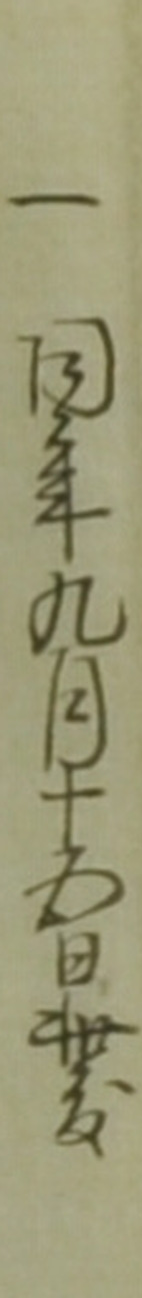一同年九月十五日此度
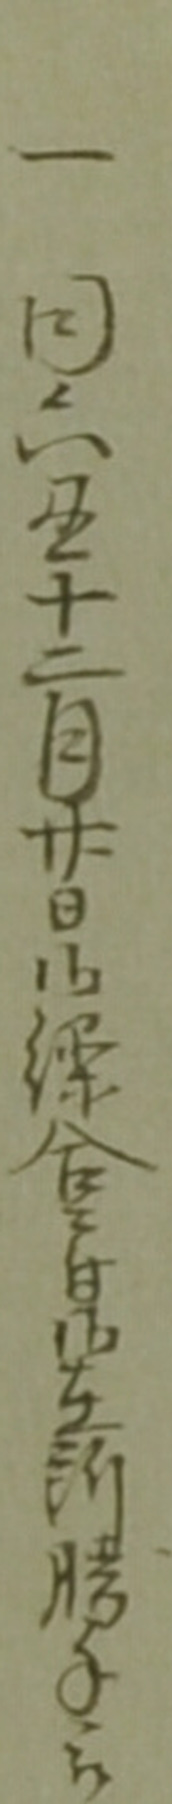一同六丑十二月廿日御繰合ニ付御在所勝手被仰付
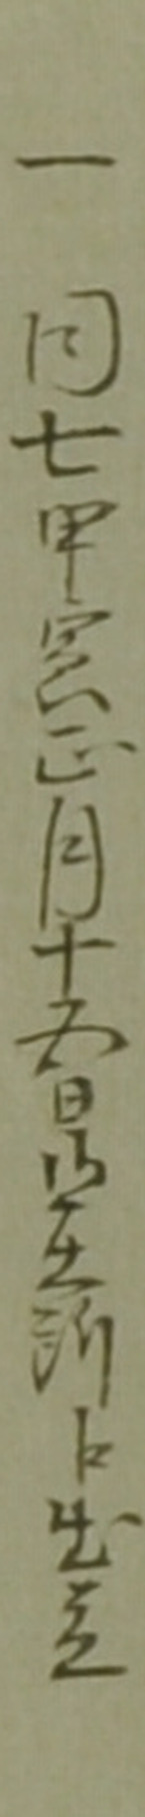一同七甲寅正月十五日御在所江出立
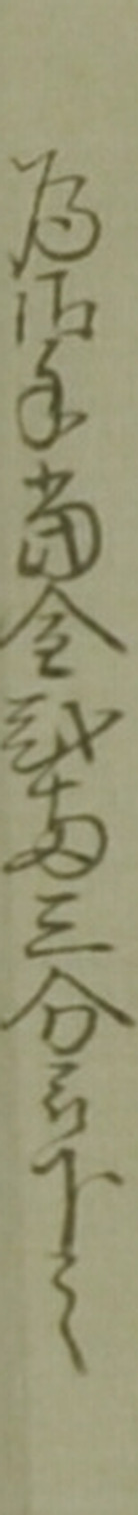為御手当金弐両三分被下之
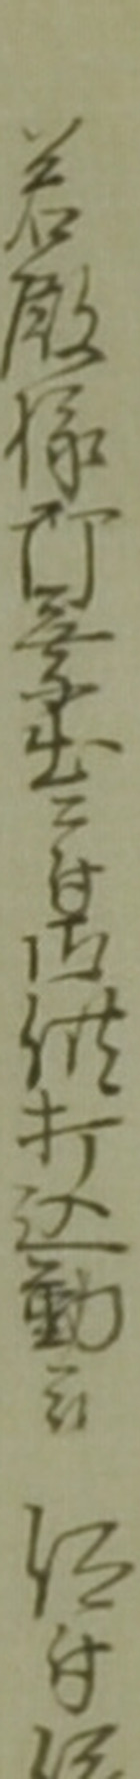若殿様御乗出ニ付御供打込勤被仰付依之

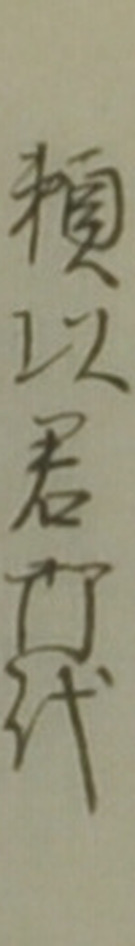頼以君御代
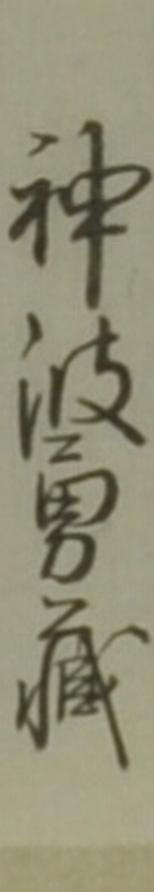神波勇蔵
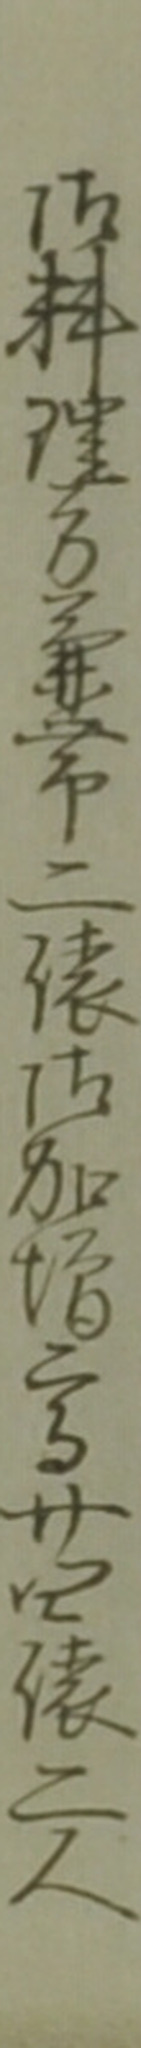御料理方兼帯二俵御加増高廿四俵二人
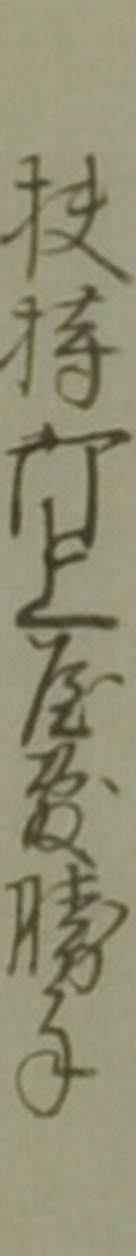扶持御上屋敷勝手
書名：無足諸士勤仕録（一）
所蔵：伊那市立高遠町図書館・合同会社AMANE
